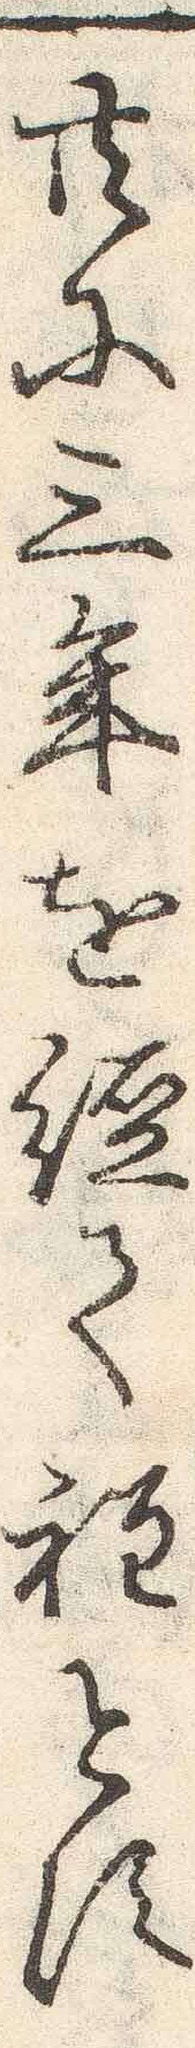共に三年を経て程とす
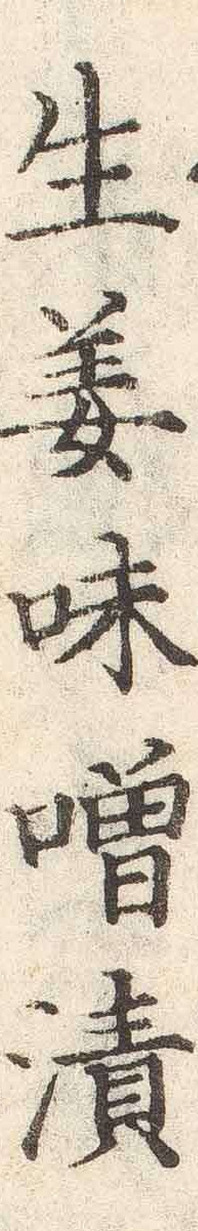生姜味噌漬
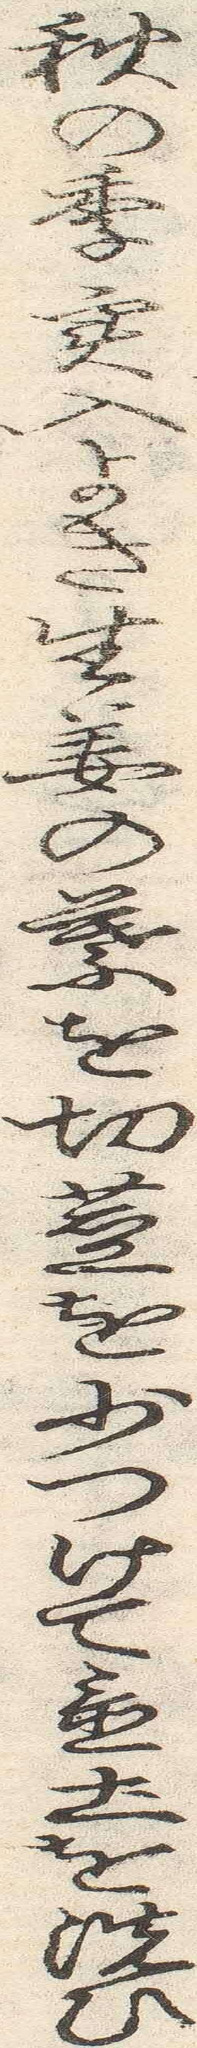秋の季実入よき生姜の葉を切茎を少つけて置土を洗ひ
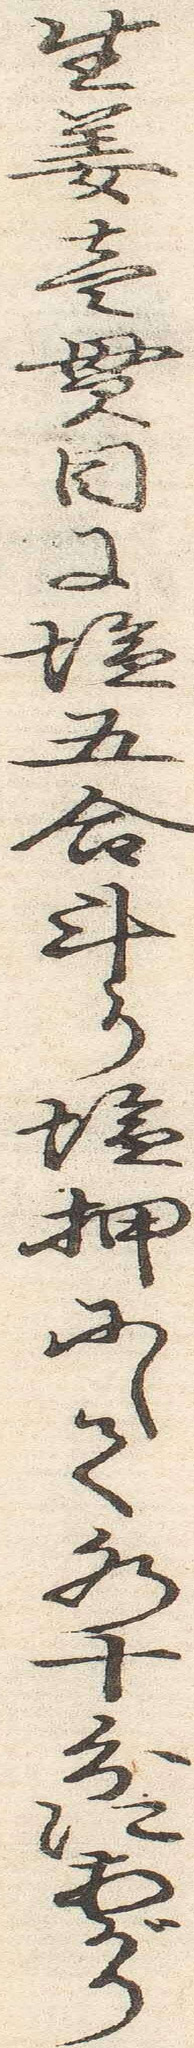生姜壱貫目に塩五合斗り塩押にして水十分にあがり
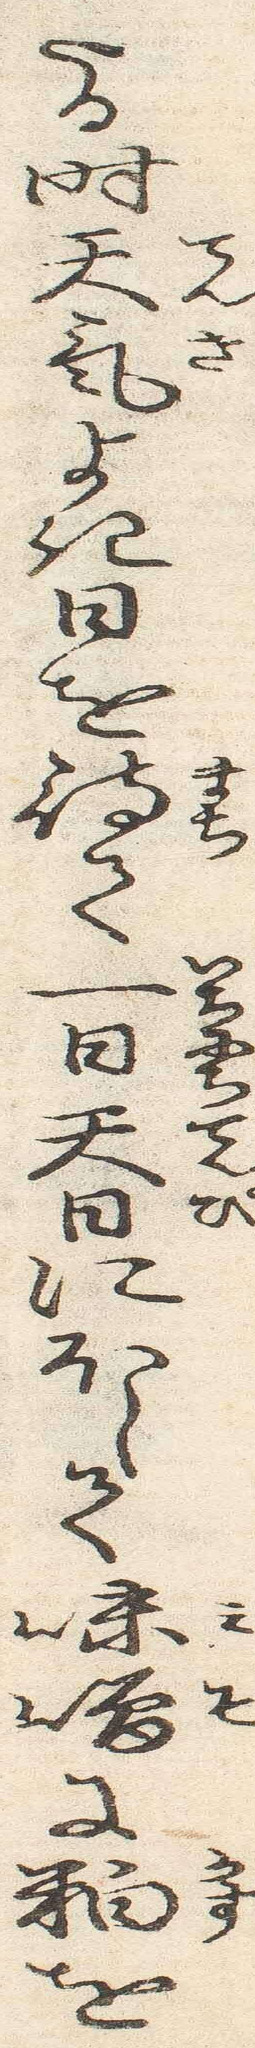たる時天気よき日を待て一日天日にほして味噌に粕を
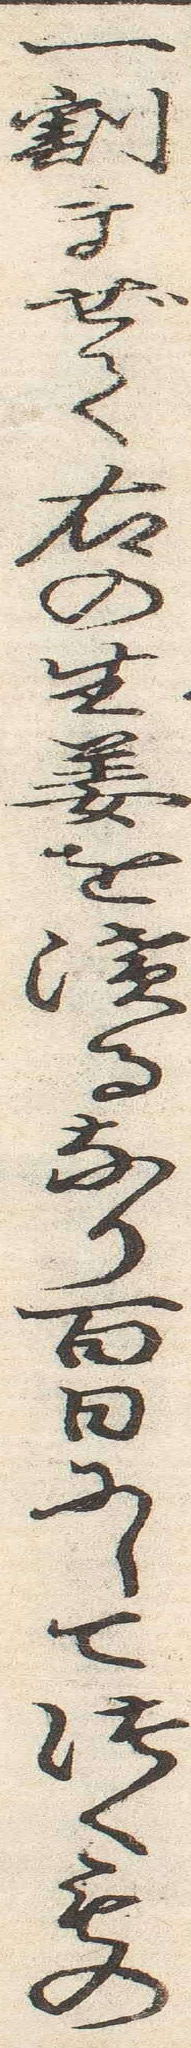一割まぜて右の生姜を漬るなり百日にしてつくもの
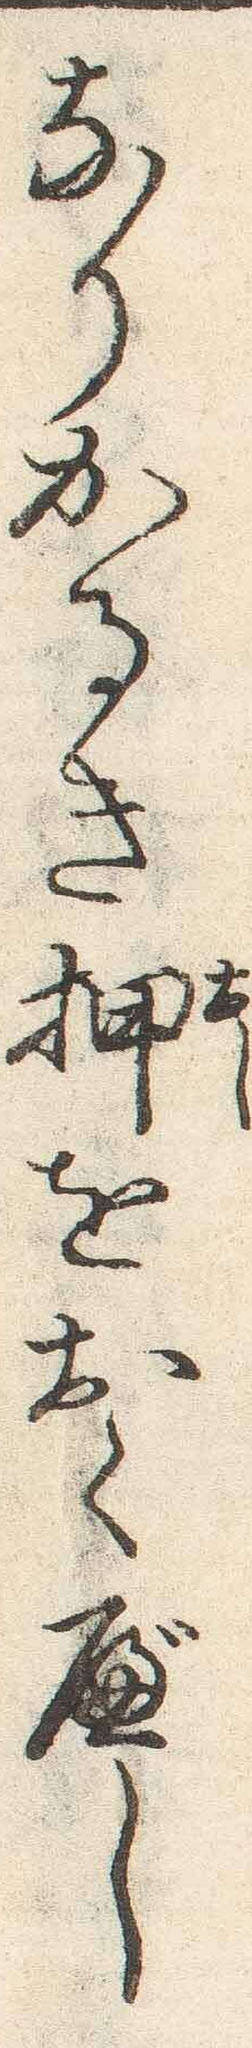なりかるき押をおくべし
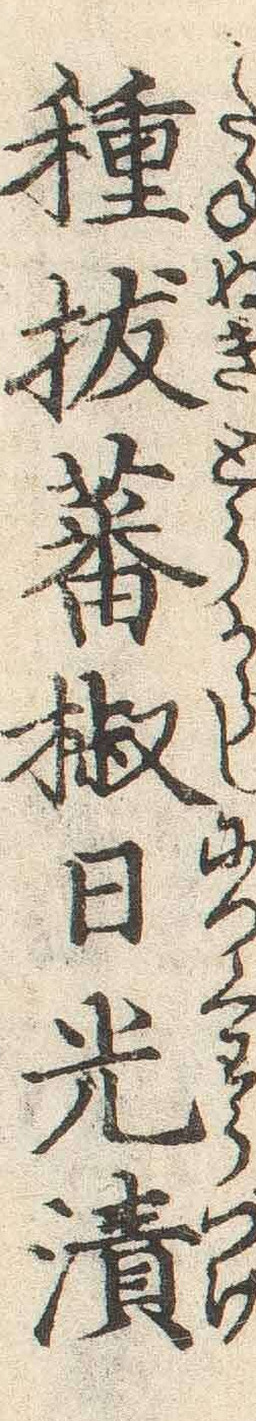種抜蕃椒日光漬

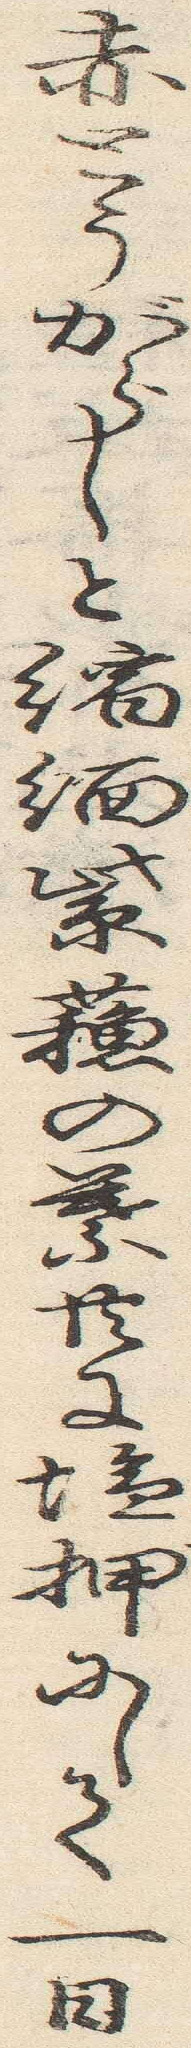赤とうがらしと縮緬紫蘇の葉共に塩押にして一日
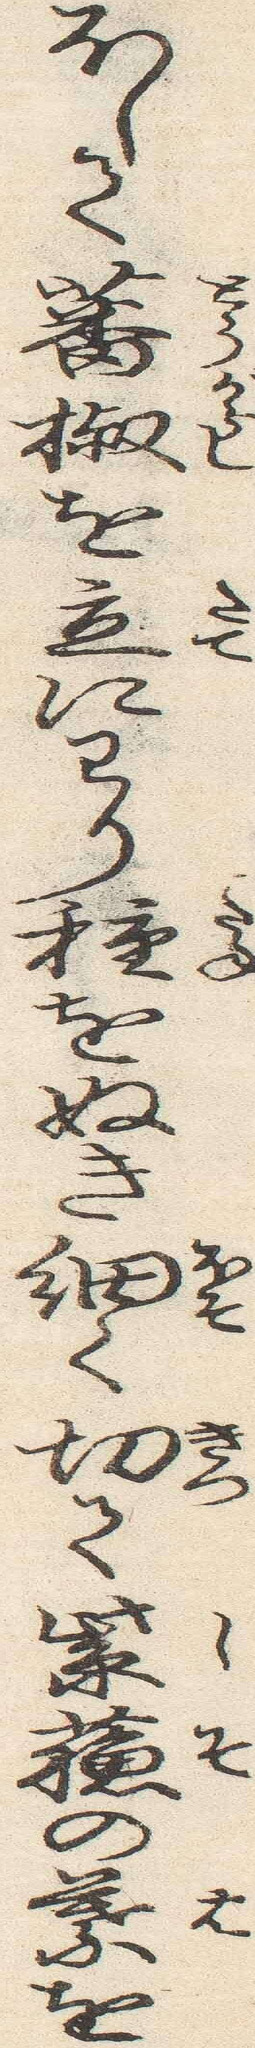ほして蕃椒を立にわり種をぬき細く切て紫蘇の葉を
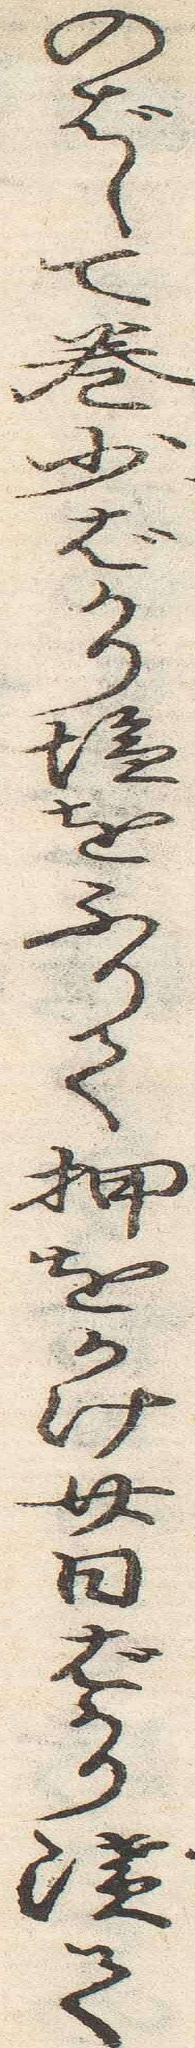のばして巻少しばかり塩をふりて押をかけ廿日ばかり漬て
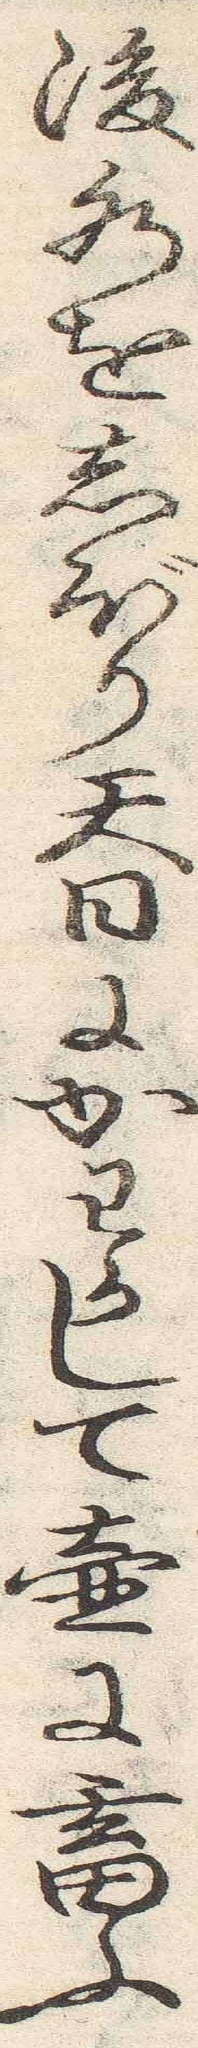後水をしぼり天日にかわかして壺に蓄ふ
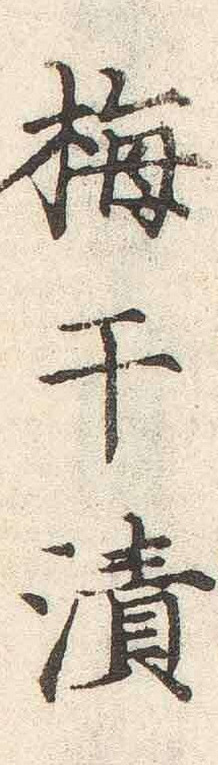梅干漬
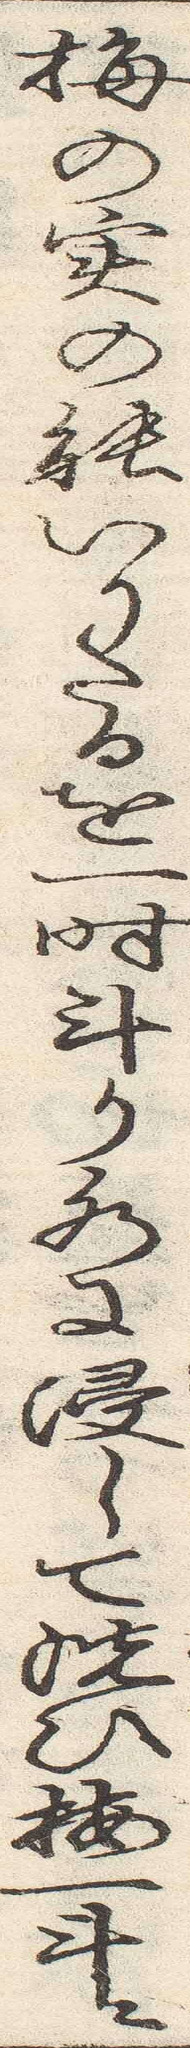梅の実の能いりたるを一時斗り水に浸して洗ひ梅一斗に
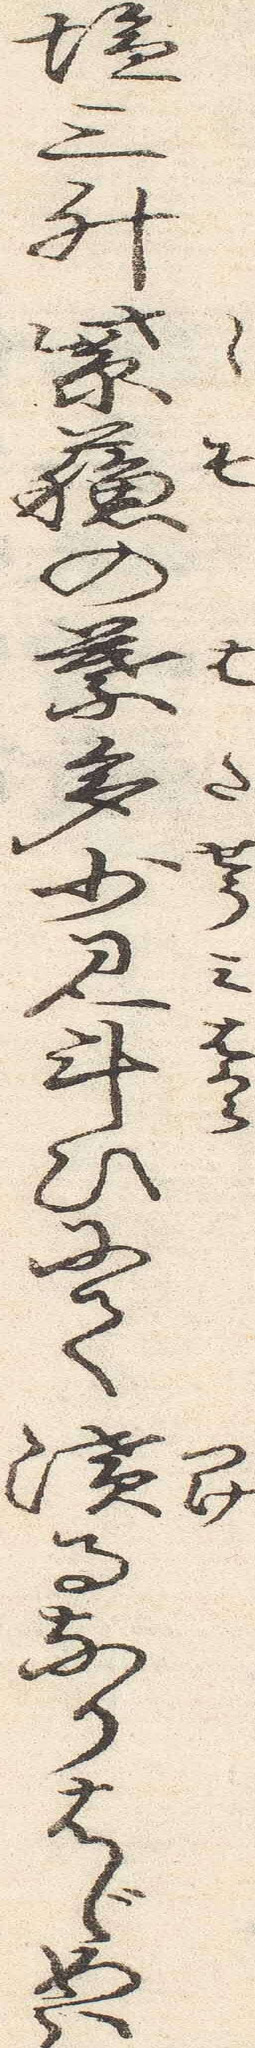塩三升紫蘇の葉多少見斗ひにて漬るなりはじめは
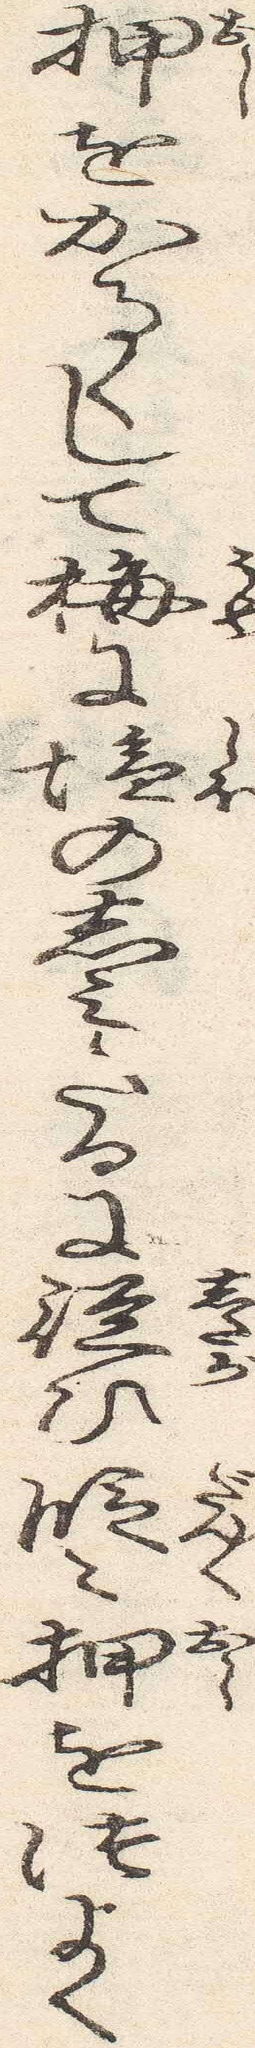押をかるくして梅に塩のしみたるに従ひ段々押をつよく
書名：四季漬物塩嘉言
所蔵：東京学芸大学附属図書館 国文学研究資料館
